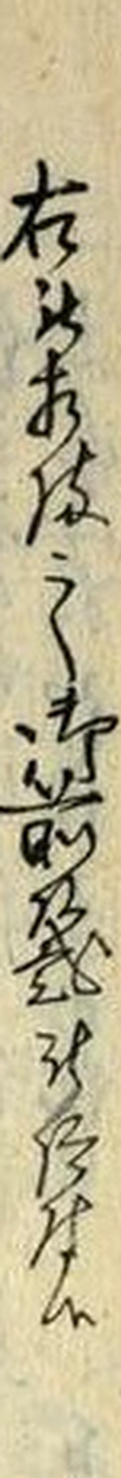右被相備之御前頂戴被仰付候
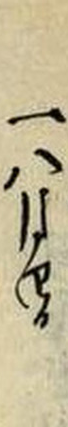一八月四日
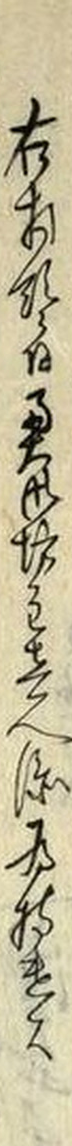右拝領ニ付奥御坊主壱人添為持遣ス
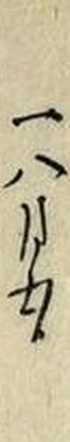一八月五日
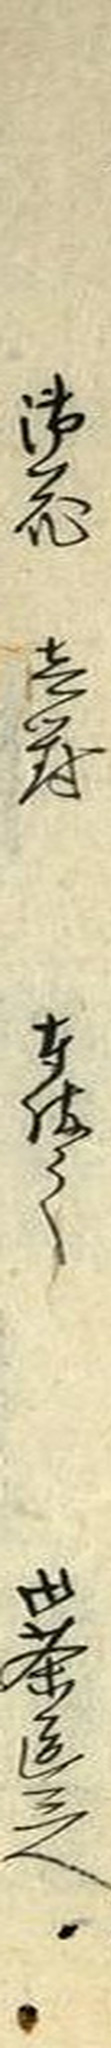御花壱対奉備之御茶道三人
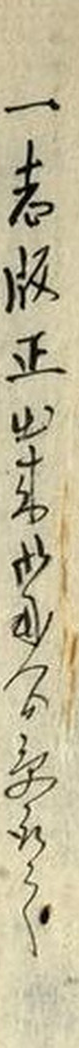一志版正出来御用人ゟ受取之
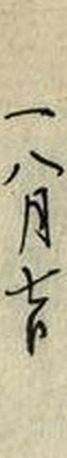一八月七日
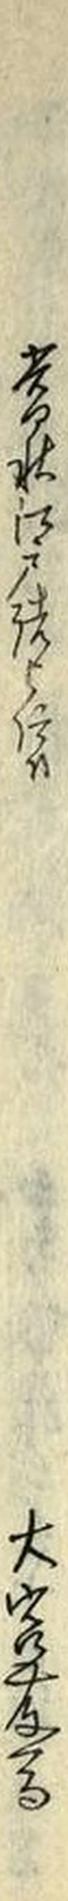当秋江戸詰被仰付大宮藤馬
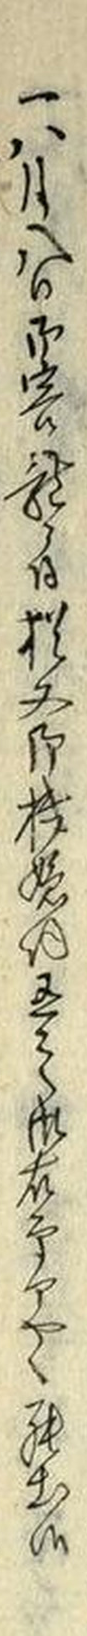一八月八日御容體ニ付猶又御機嫌伺有之御右筆部やへ罷出候
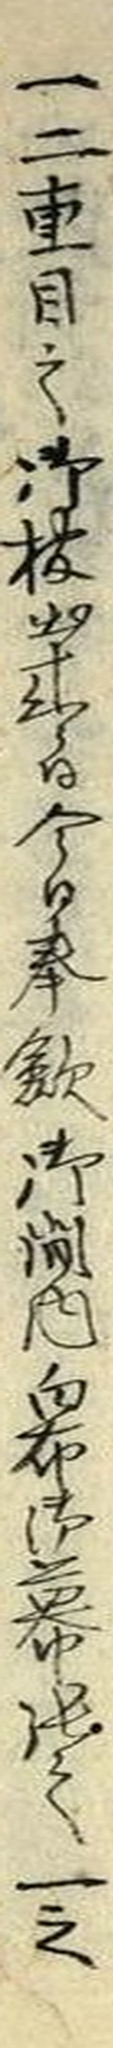一二重目之御棺出来ニ付今日奉歛御間内白布御幕張之一之
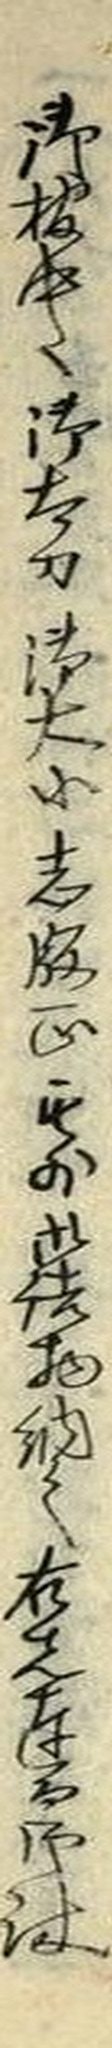御棺中へ御太刀御大小志版正其外御詰物納之右先達而御沐
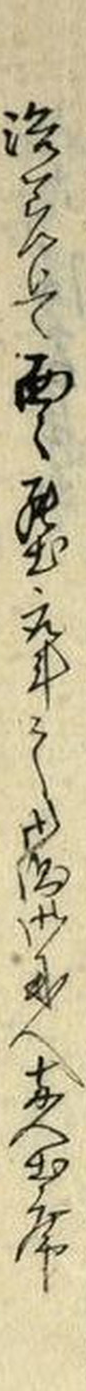浴差上候面々罷出取斗之御側御用人両人出席
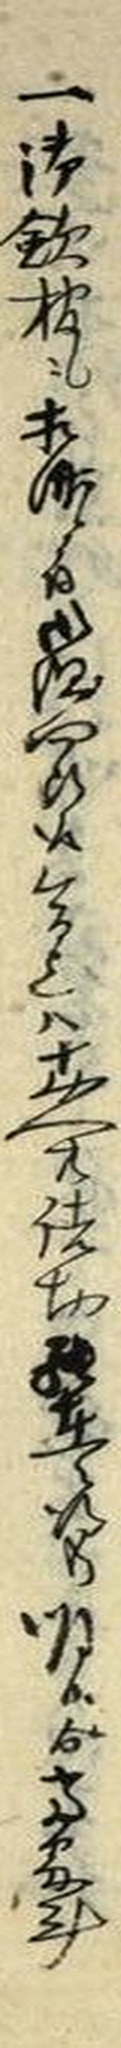一御歛棺も相済候ニ付御側向頭取今日迄ハ両人共詰切罷在候得共明日ゟ当番斗

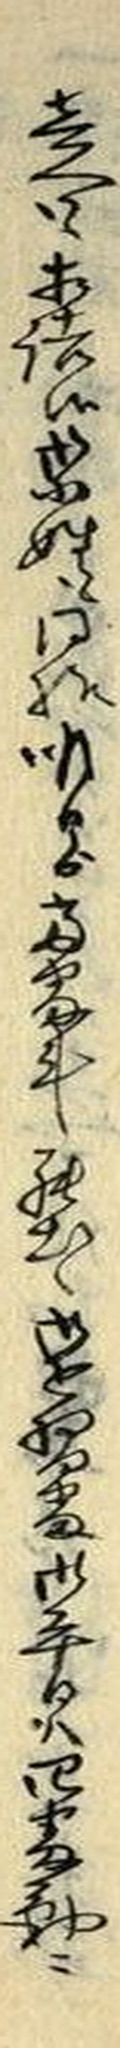壱人ツヽ相詰候御小姓も同様明日ゟ当番斗罷出候御近習番御平日ハ四番勤ニ
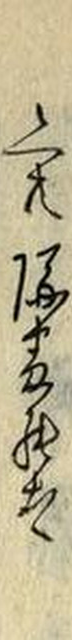候へ共隔番罷出候
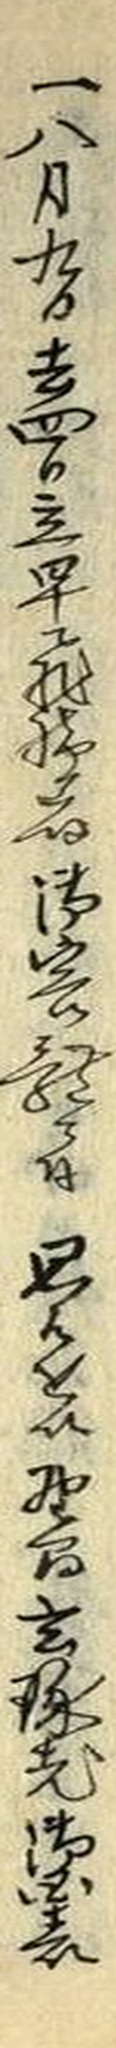一八月九日去四日立早飛脚着御容體ニ付思召を以野間玄琢老御国表
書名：少傅日録抄（斉善付側向頭取日記、江戸并道中、初入在国、逝去後…
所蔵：福井県文書館 Fukui Prefectural Archives
